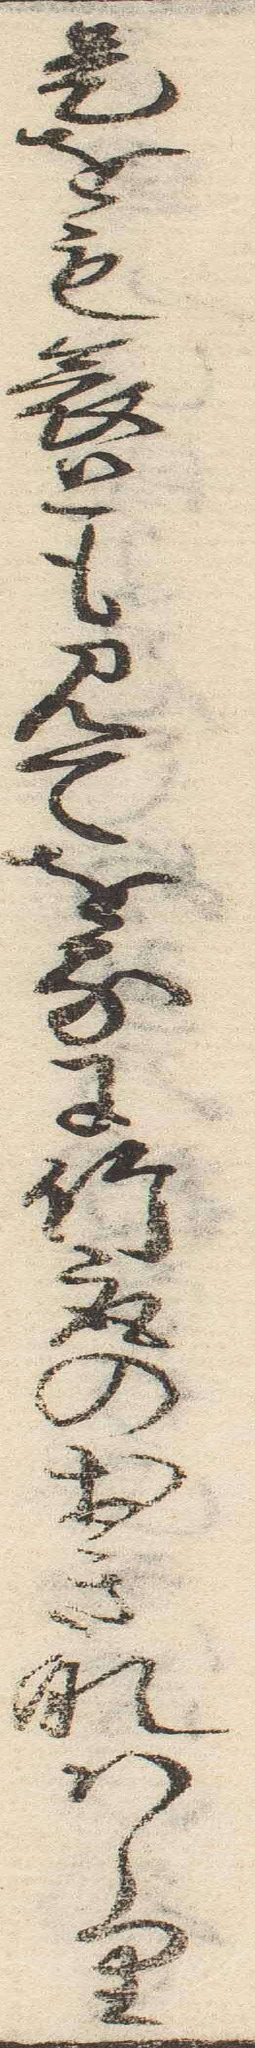是をも哀とも見てをるに竹取のおきなはしり
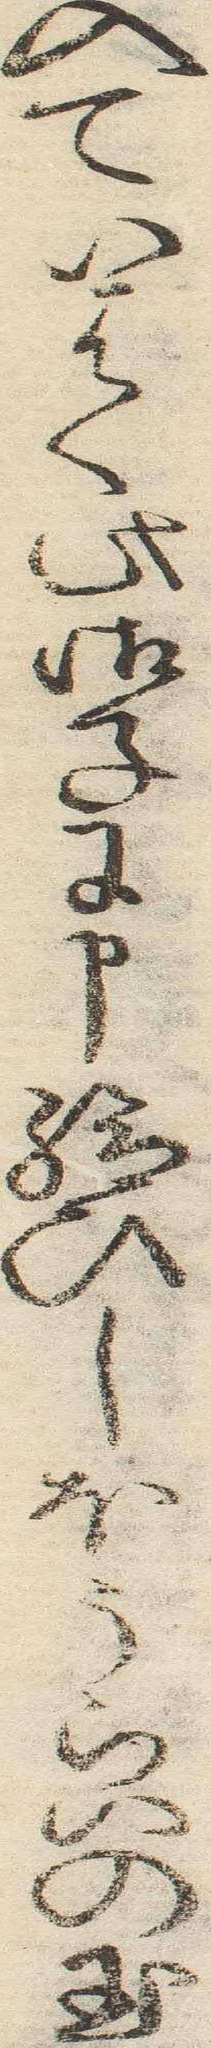入ていはく此御子に申給ひしほうらいの玉
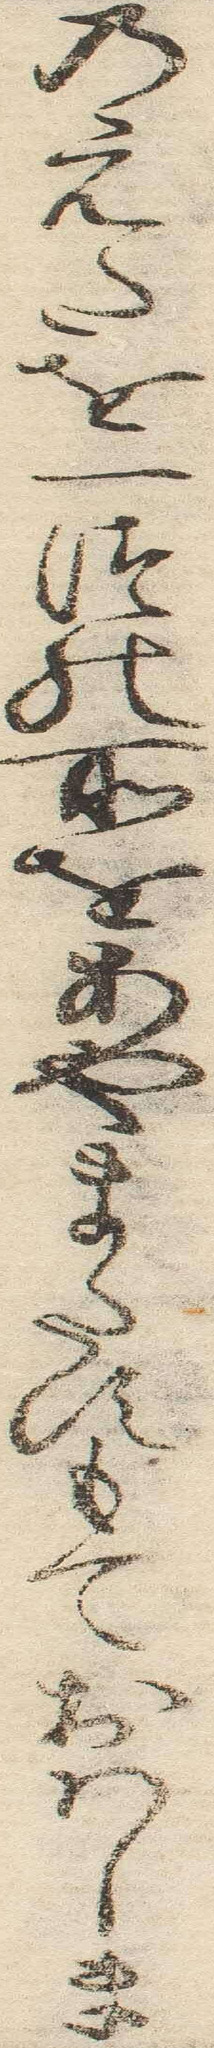のえたを一つの所をあやまたすもておはしま
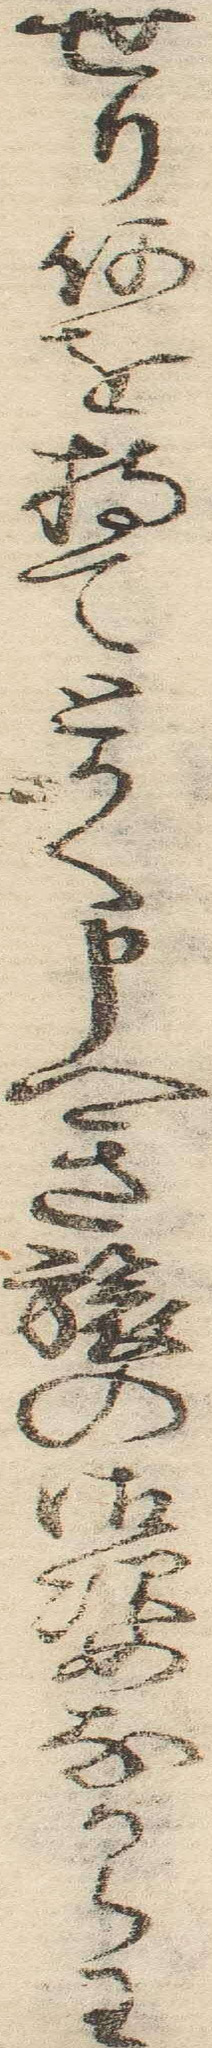せり何を持てとかく申へき旅の御姿なからわ
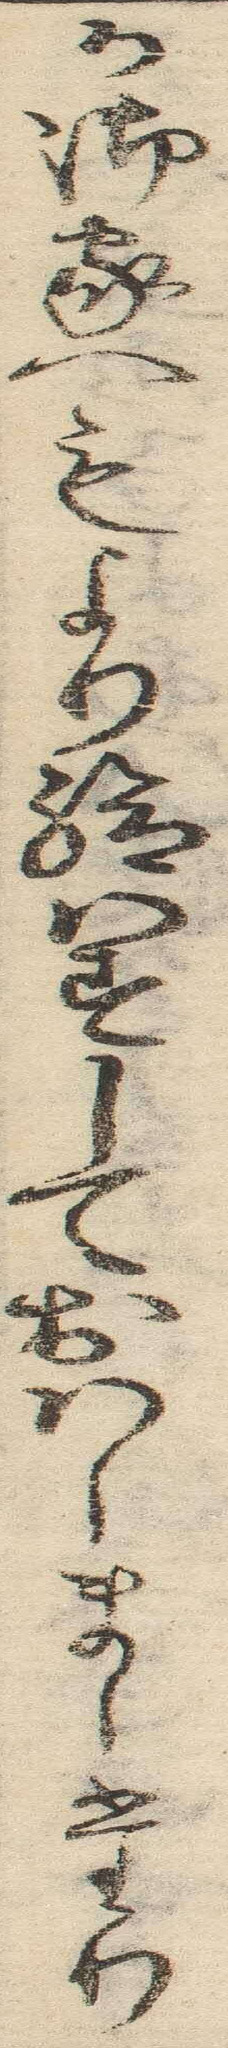か御家へもより給はすしておはしましたり

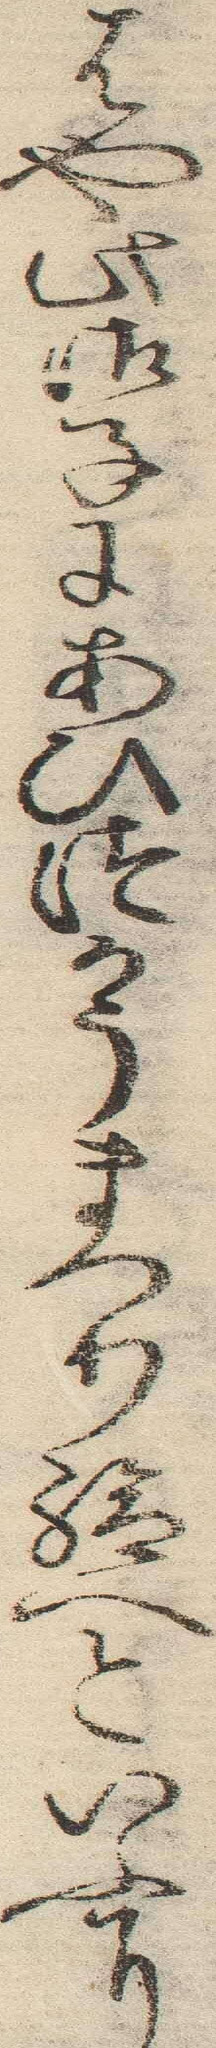はや此御子にあひかうまつり給へといふに
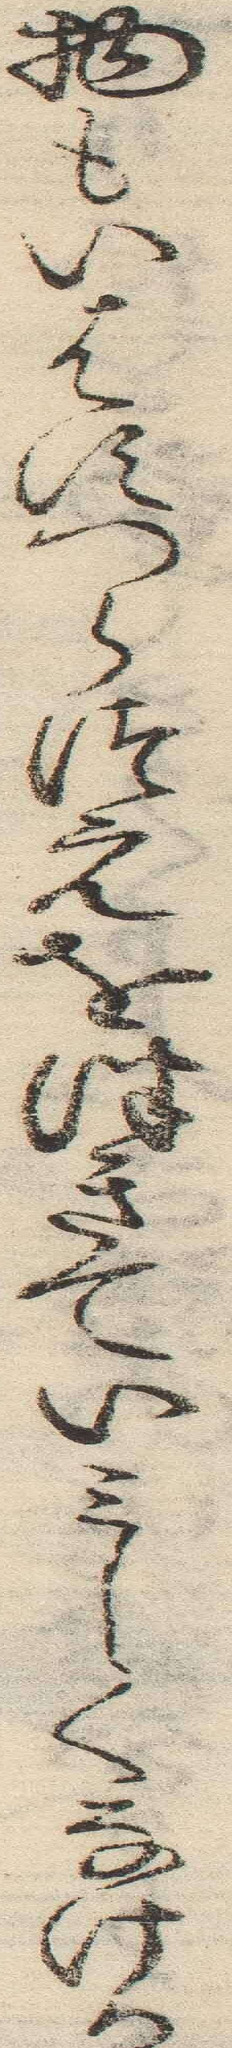物もいはすつらつえをつきていみしくなけか
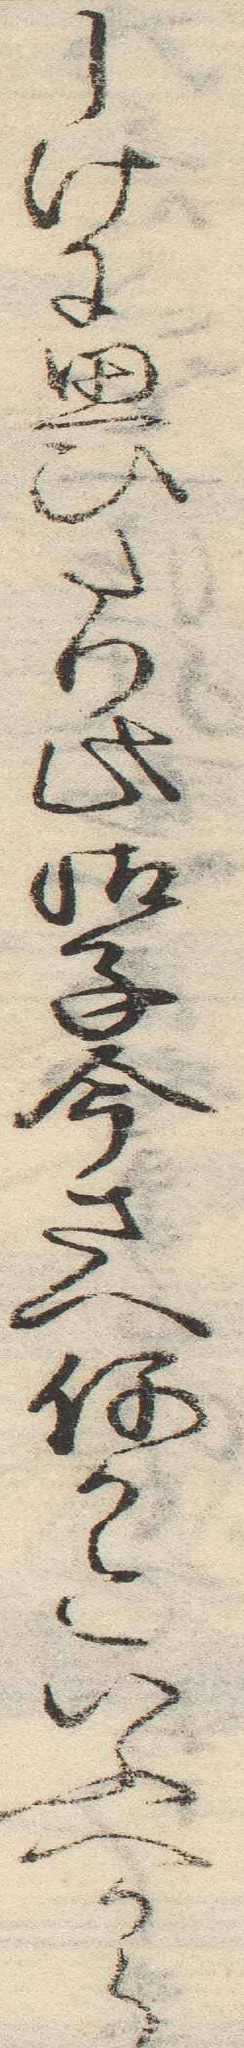しけに思ひたり此御子今さへな何かといふへから
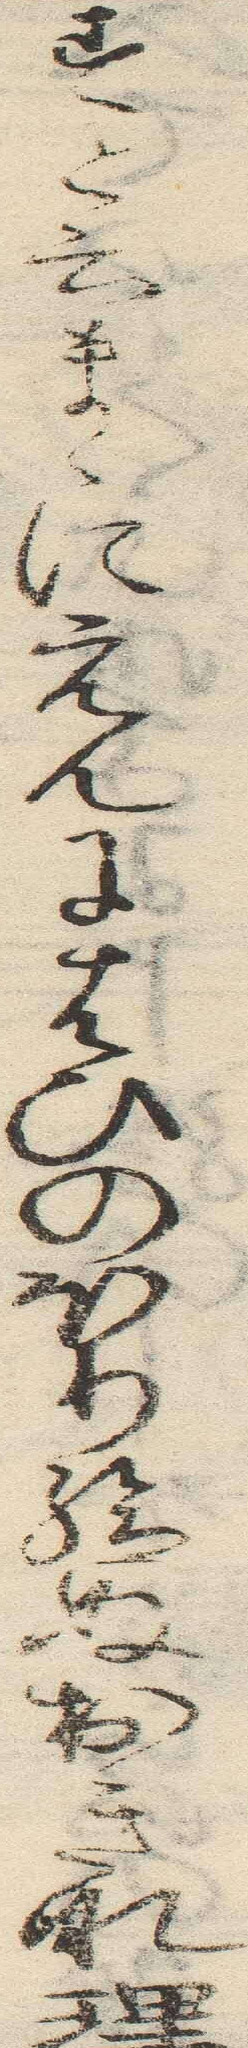すと云まゝにえんにはひのほり給ぬおきな理
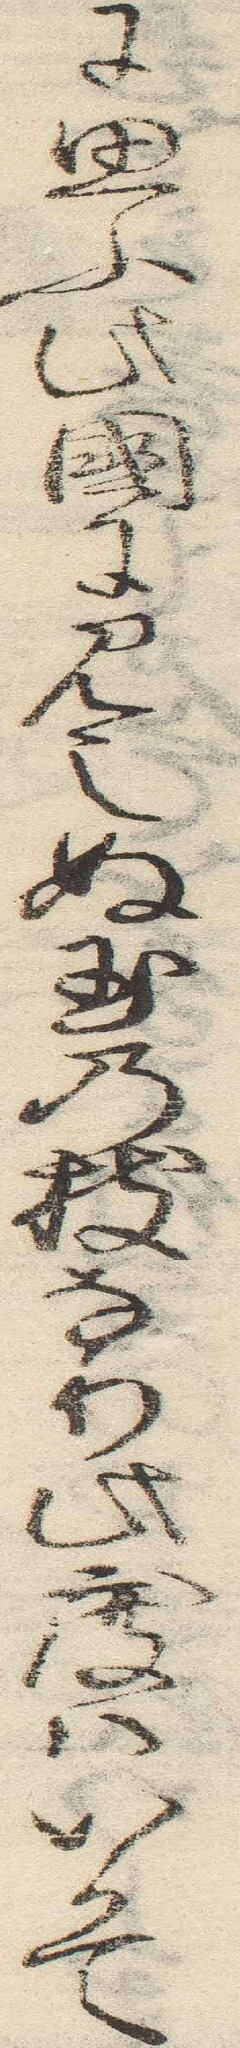に思ふ此国に見えぬ玉の枝なり此度はいかて
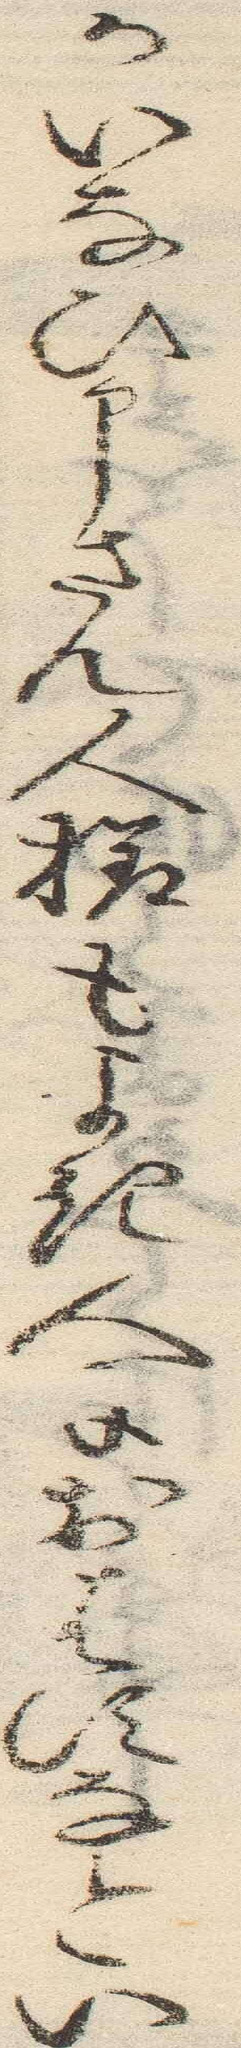かいなひ申さん人様もよき人におはすなとい
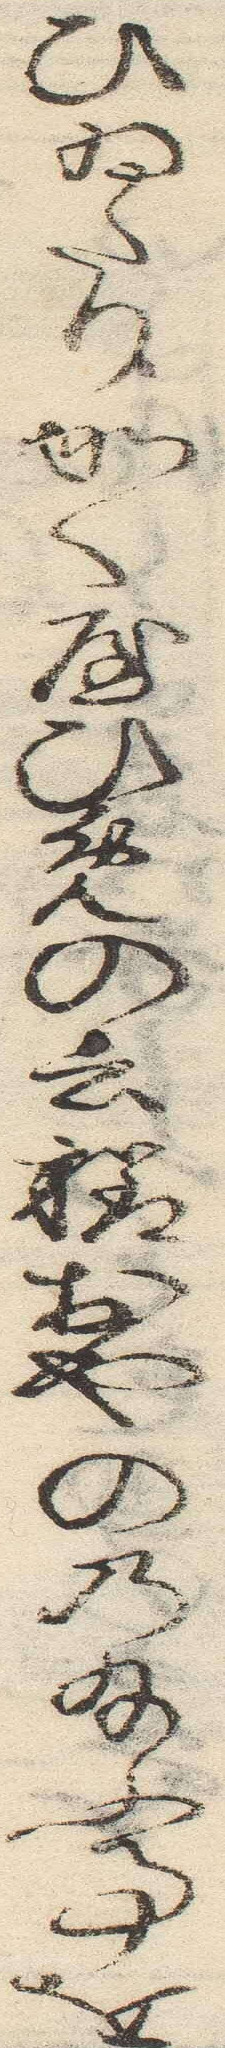ひゐたりかくやひめの云様おやの給ふ事を
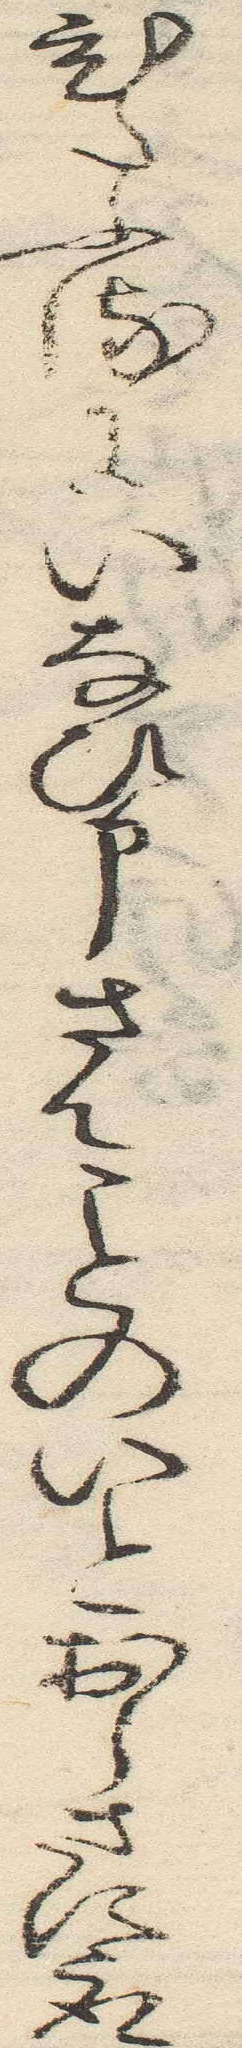ひたふるにいなひ申さんことのいとおしさに取
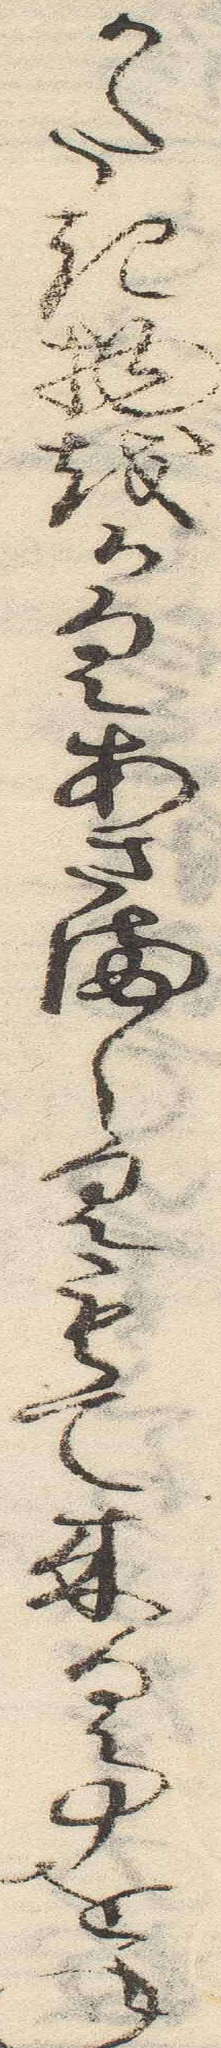かたき物をかくあさましくもて来る事をね
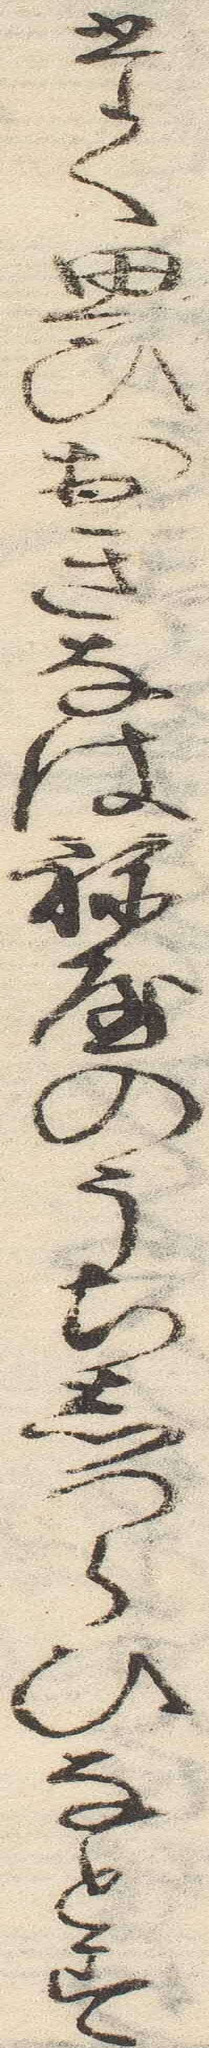たく思ひおきなはね屋のうちしつらひなとす
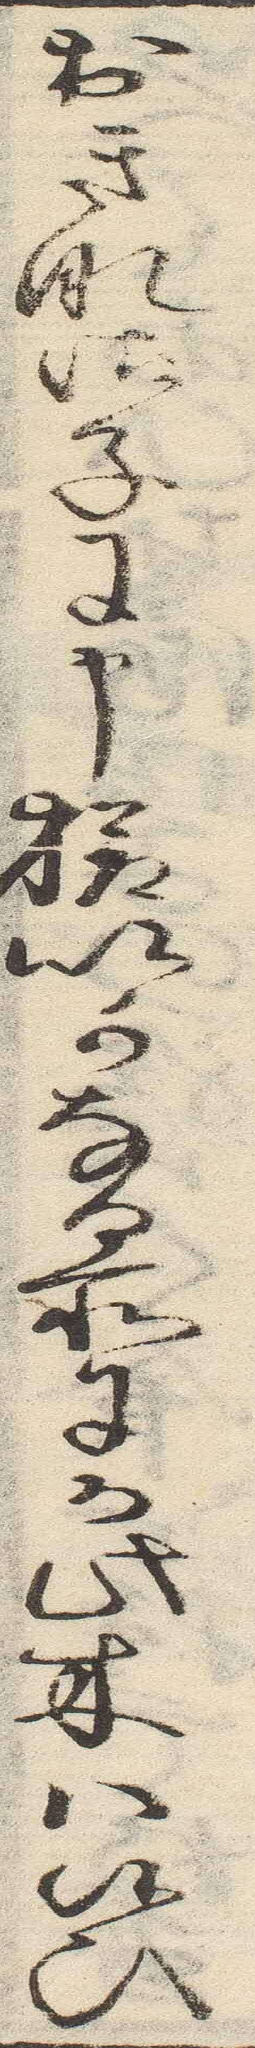おきな御子に申様いかなる所にか此木は候ひ
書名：竹取物語
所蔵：東京学芸大学附属図書館 国文学研究資料館
